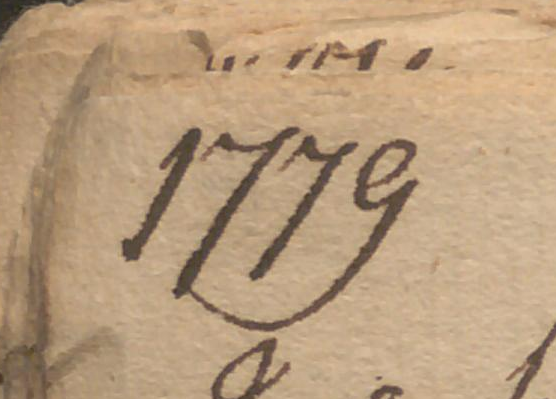1779
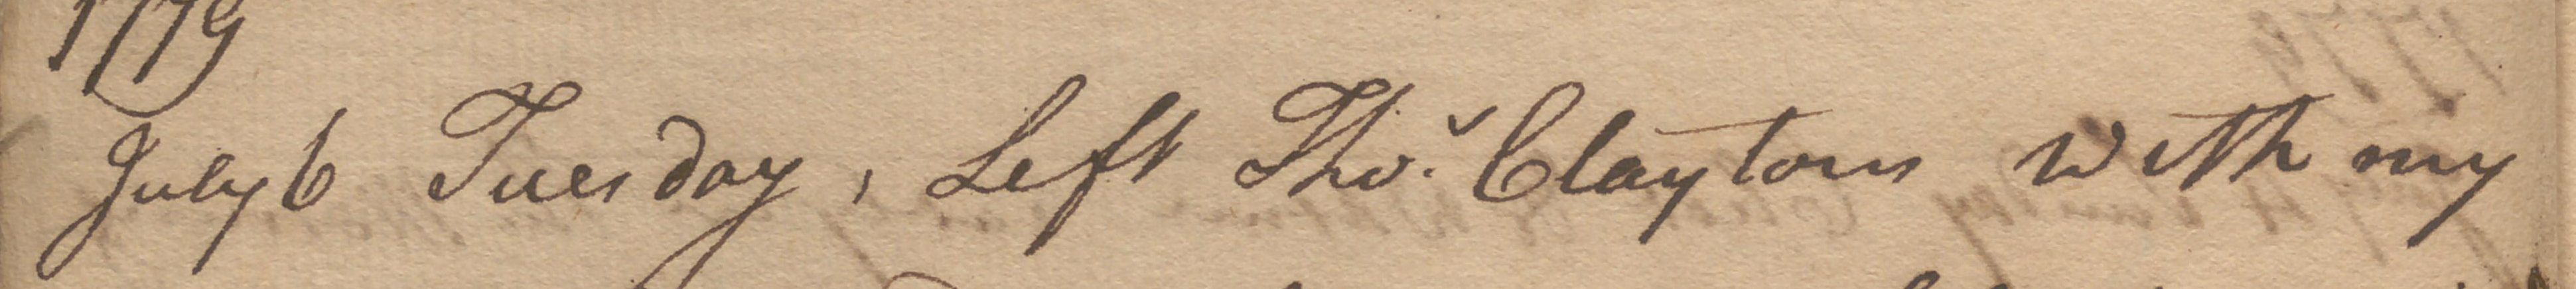July 6 Tuesday, Left Tho^s. Claytons with my
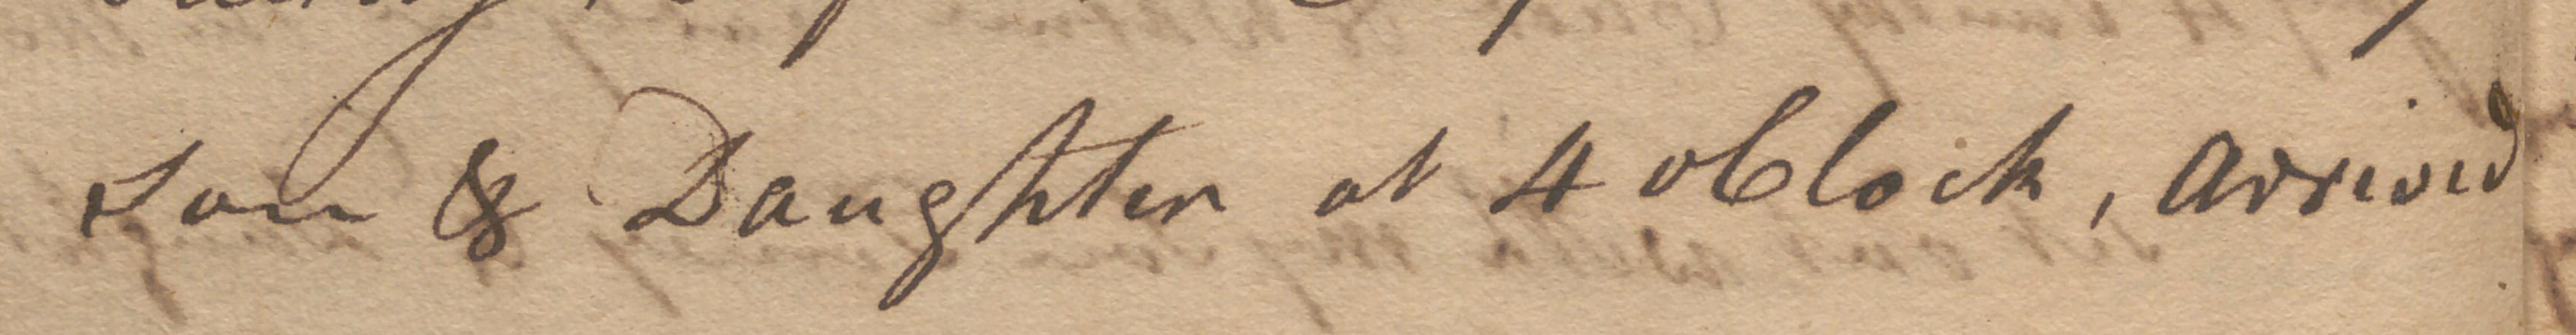son & Daughter at 4 oClock, arrived
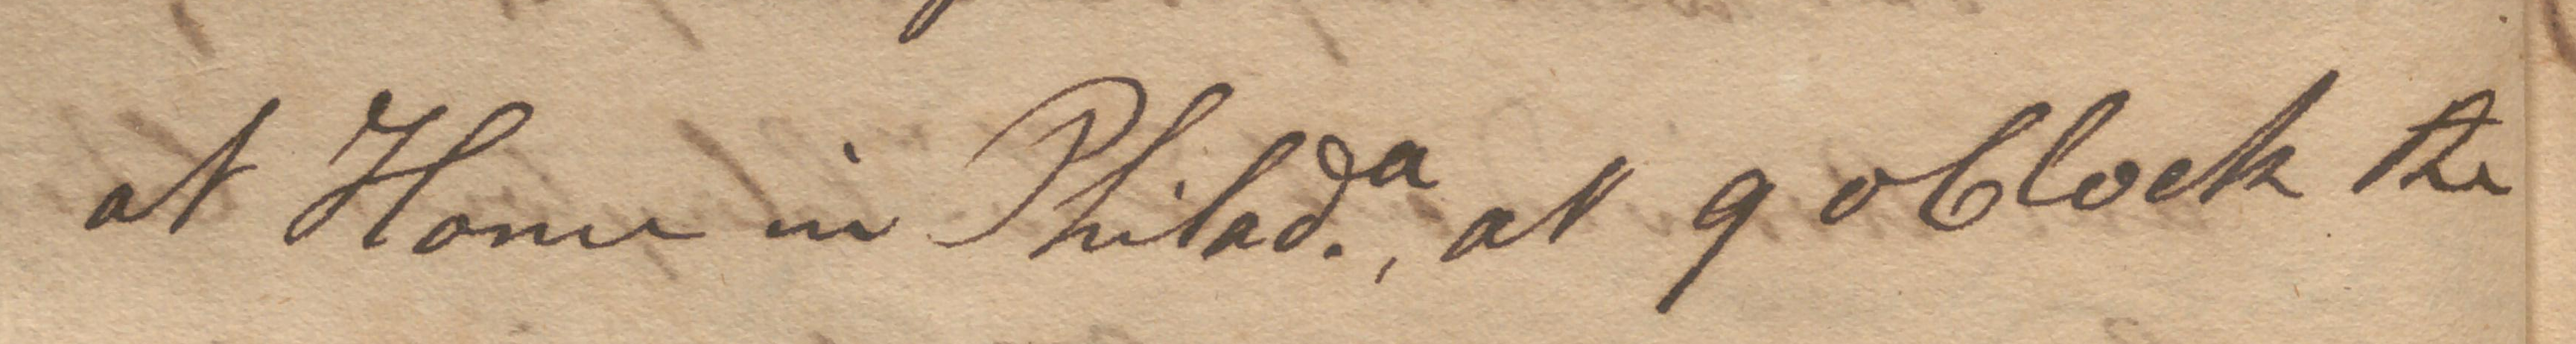at Home in Philad^a. at 9 oClock the
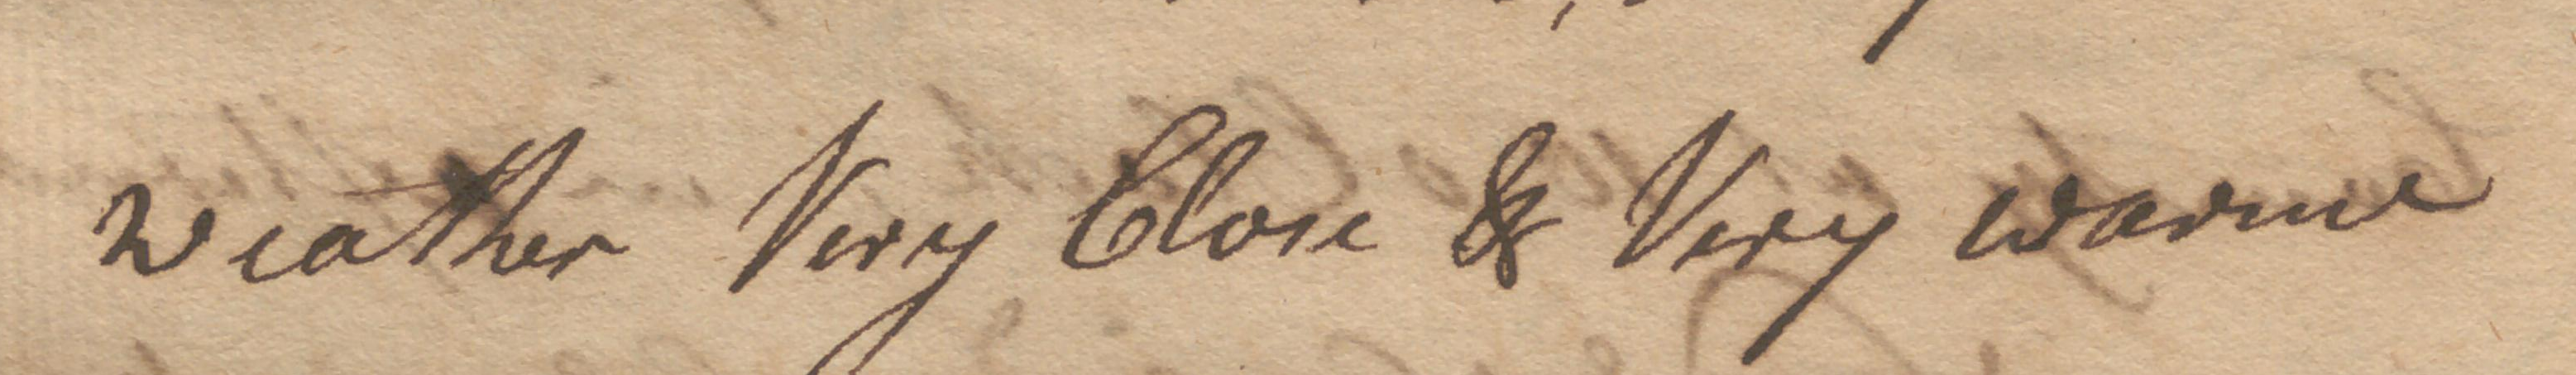weather Very Close & Very warme
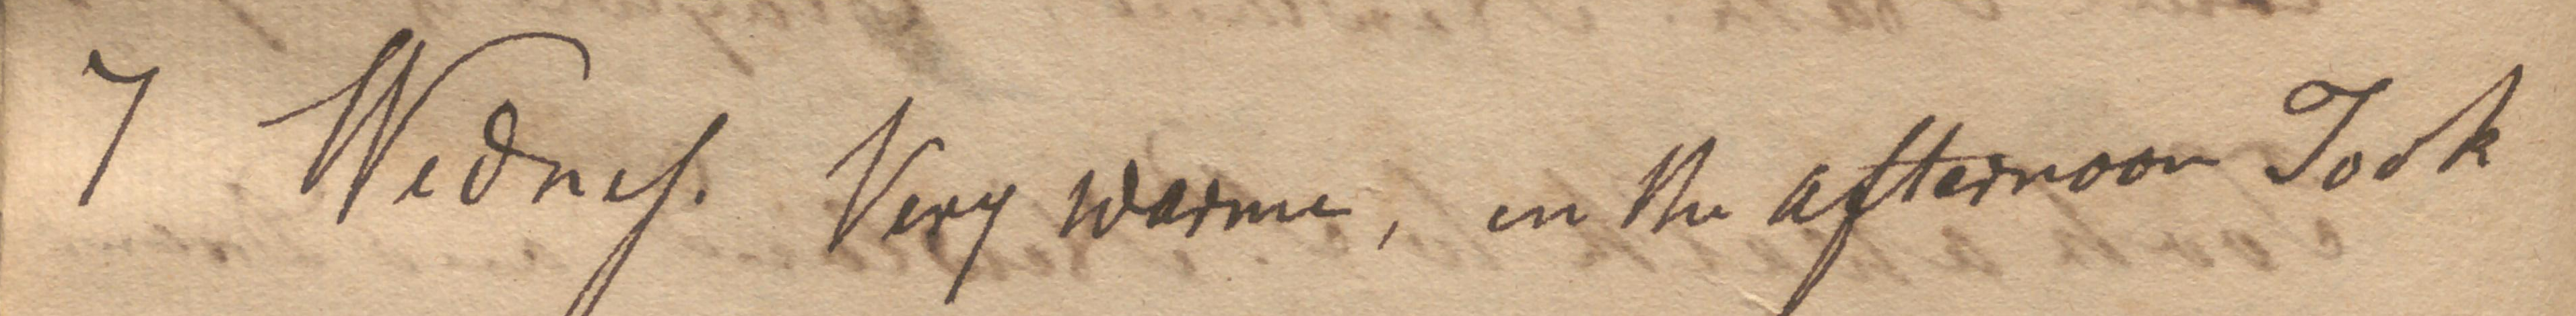7 Wednes Very warme, in the afternoon Took
